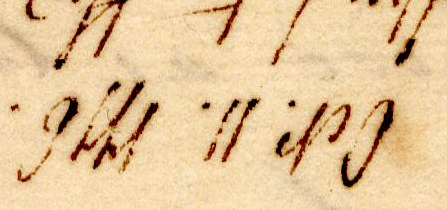Oct^r. 11. 1776.
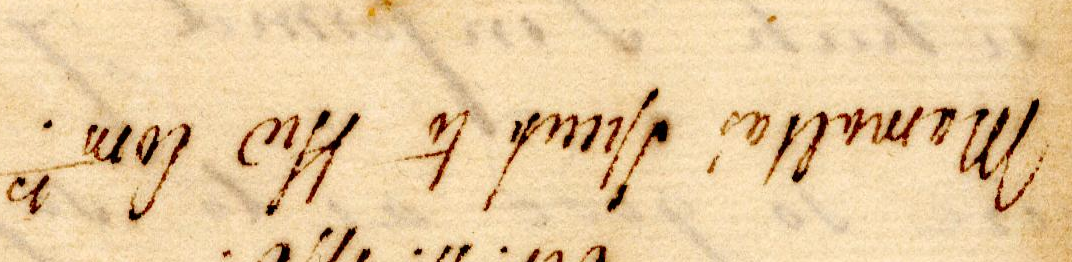Mamalta's Speech to the Com^r.
